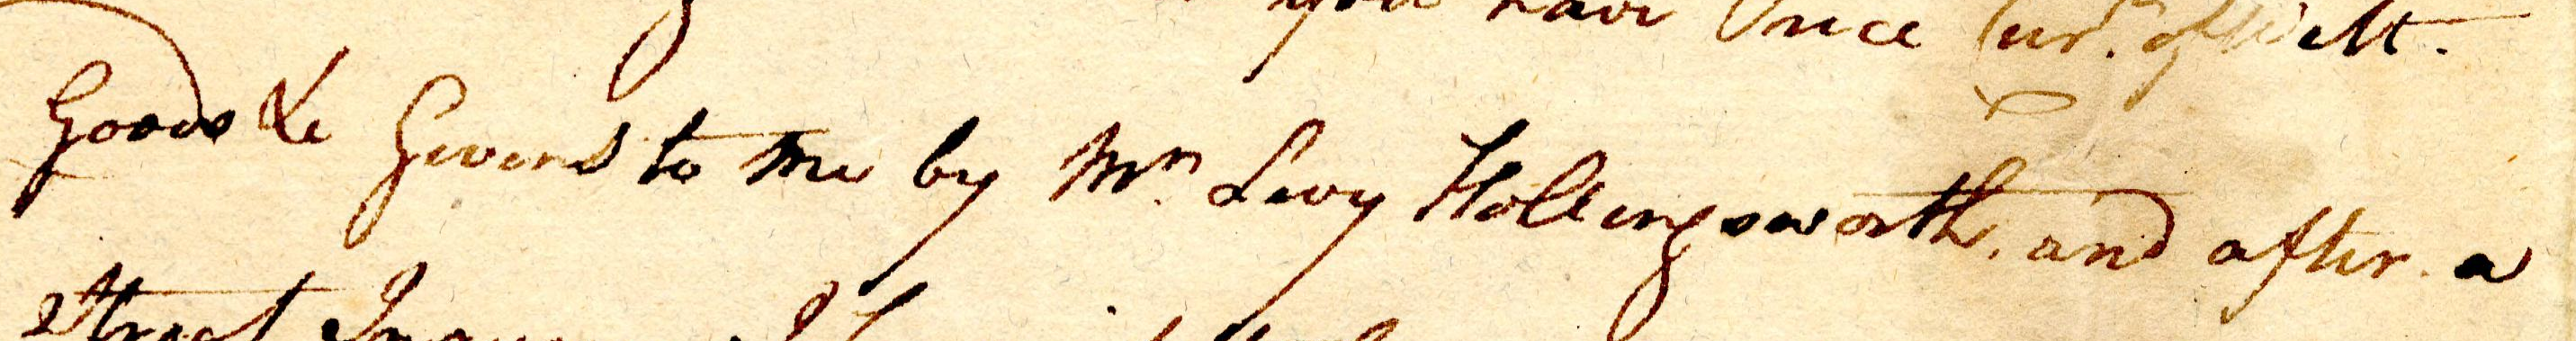goods &c. givens to me by M^r. Livy Hollingsworth, and after a
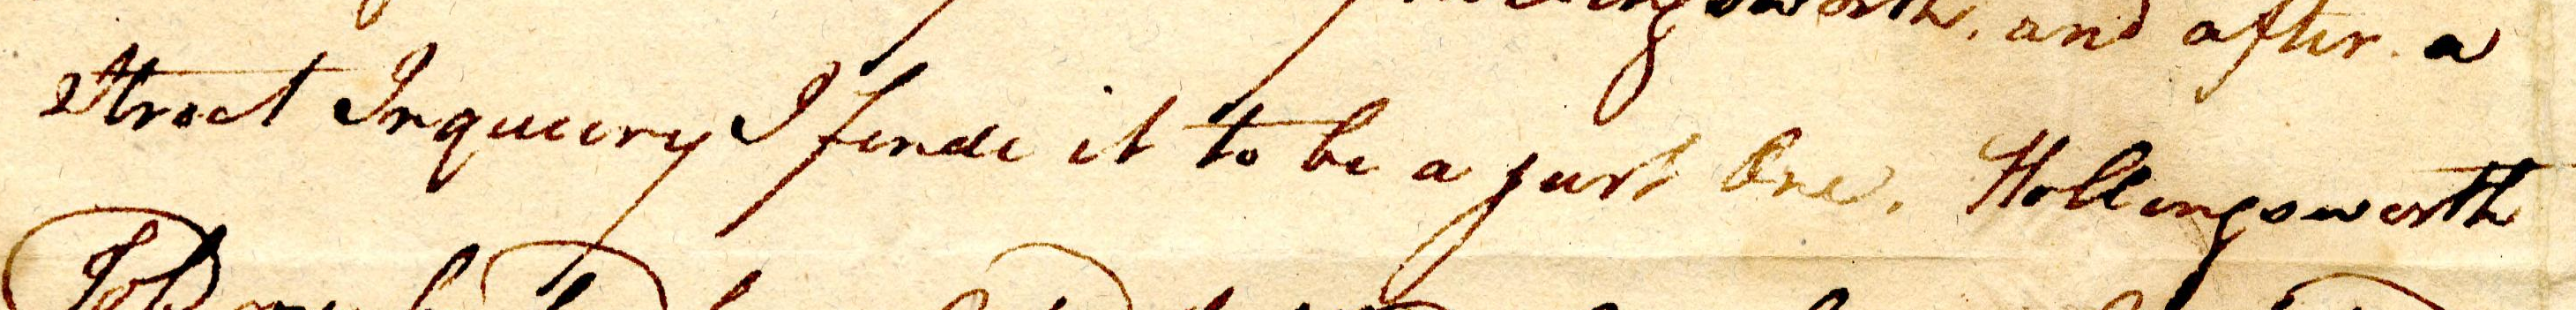strict Inquiery I finde it to be a just one. Hollingsworth
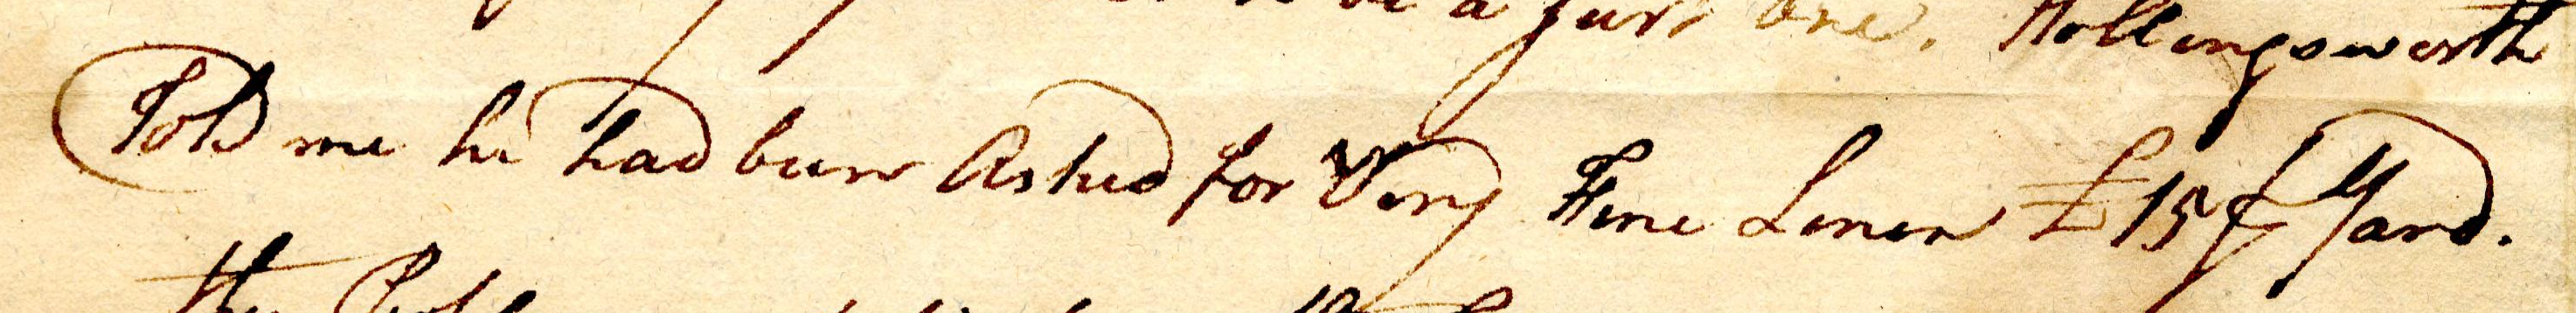told me he he had been Asked for Very Fine Linen £15 per yard.
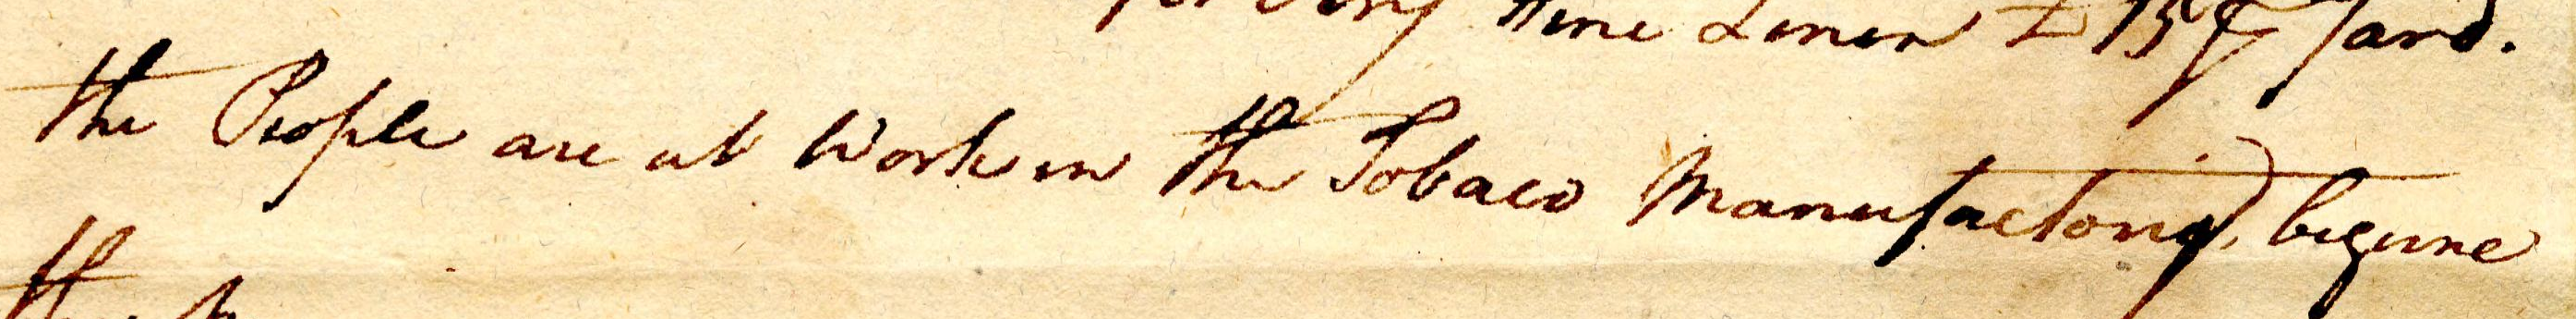the People are at work in the Tobaco Manufactoring, begune
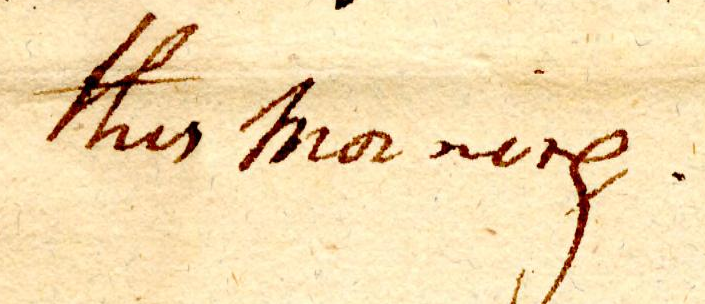this morning
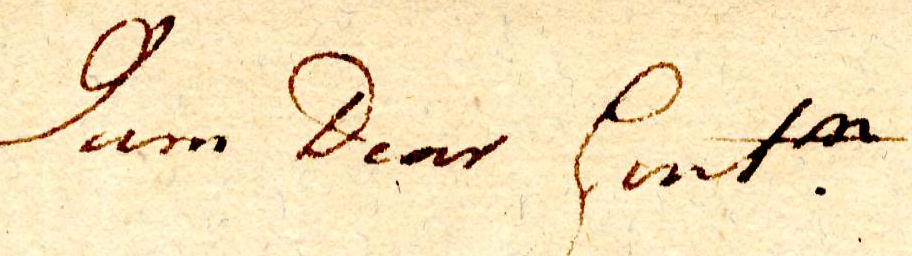I am Dear Gent^n.
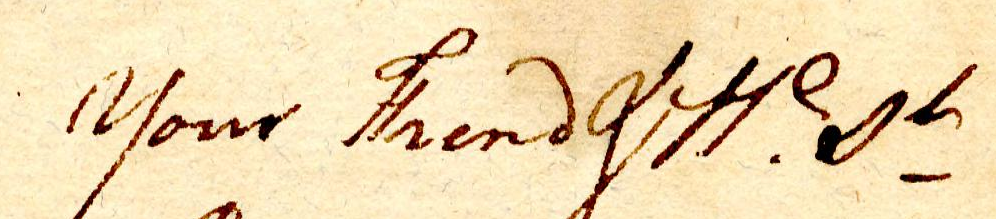Your Friend & H^l. s^t
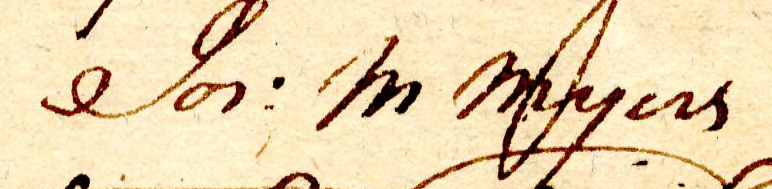Jos. M Meyers
